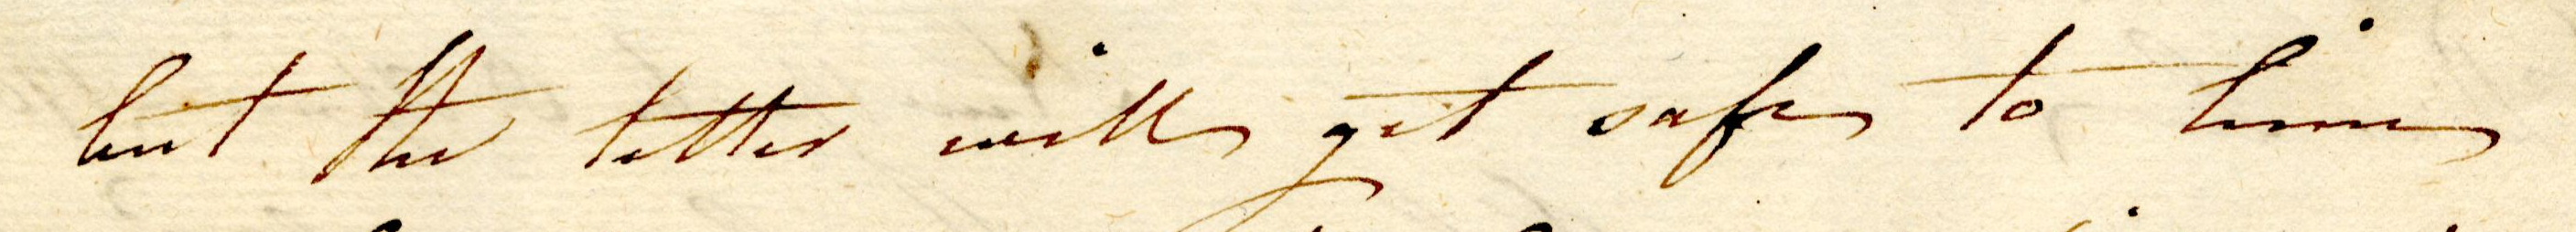but the letter will get safe to him
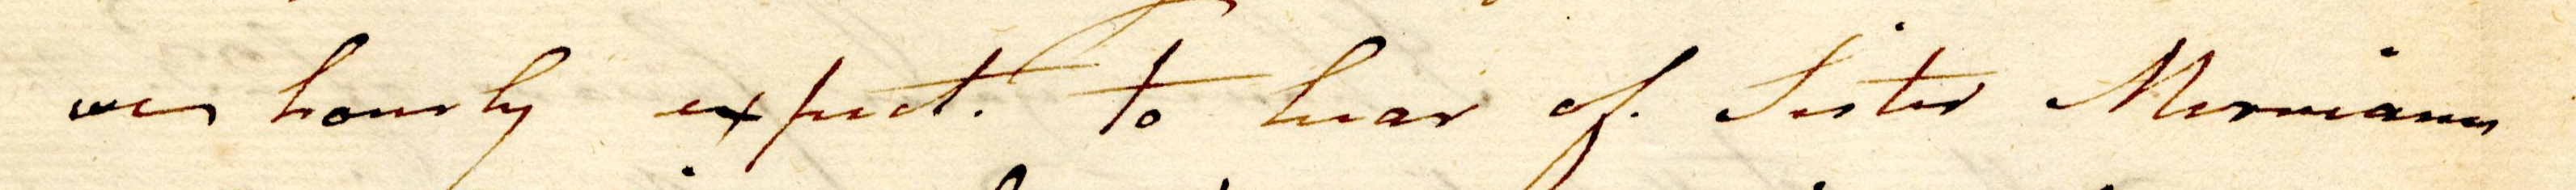we hourly expect to hear of Sister Meriams
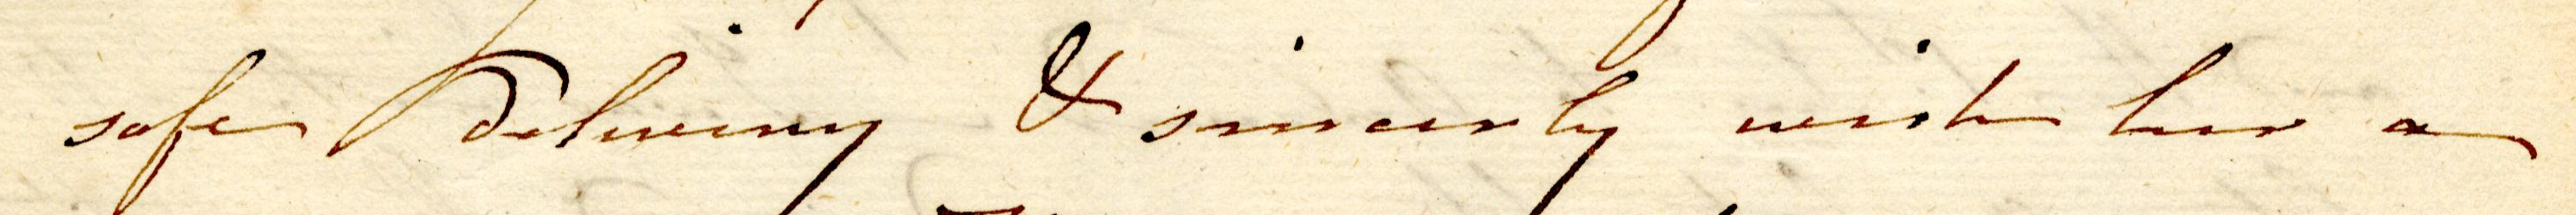safe delivery & sincerely wish her a
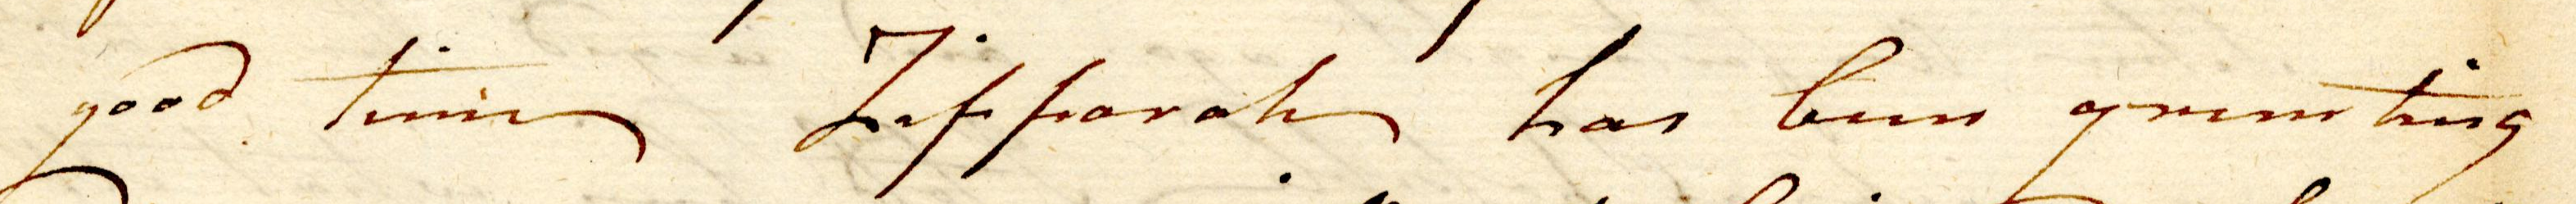good time, Zipporah has been grunting
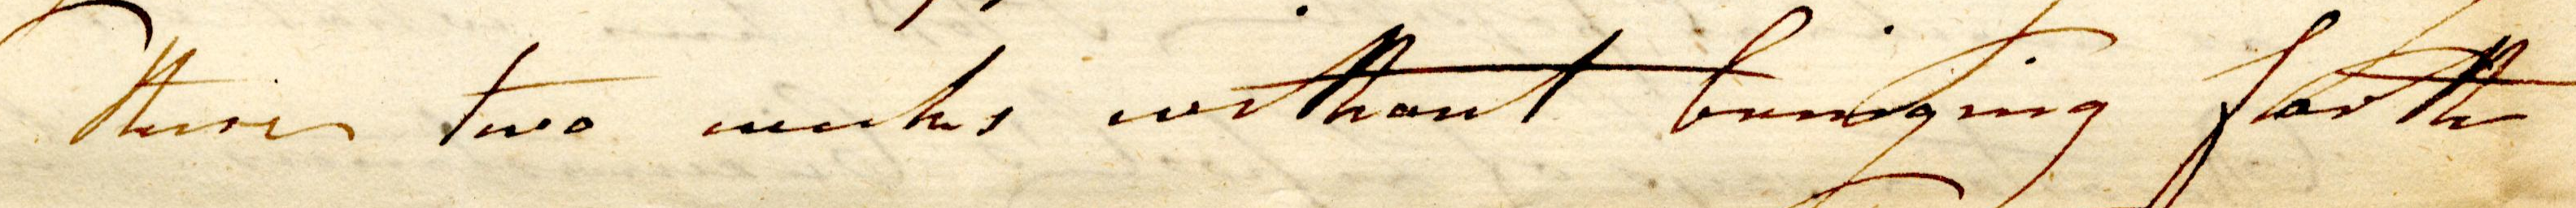these two week without bringing farther
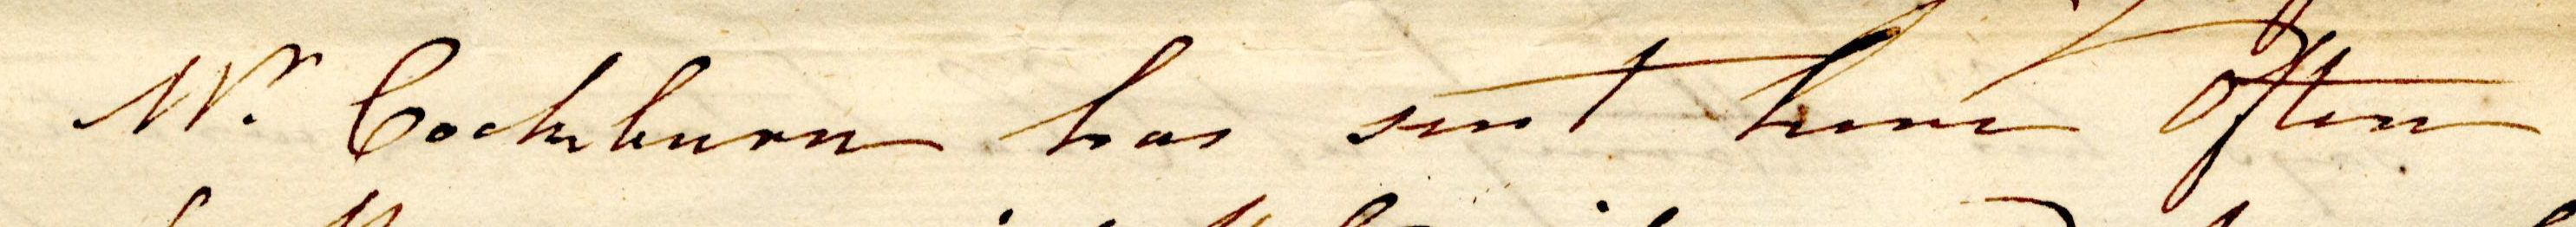M^r. Cockburn has sent here often
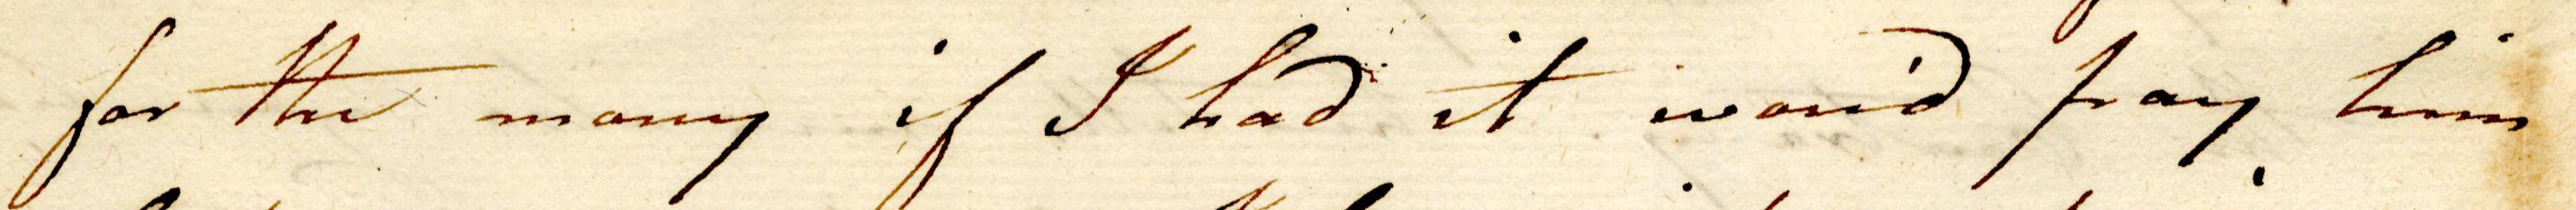for the mony if I had it wou'd pay him
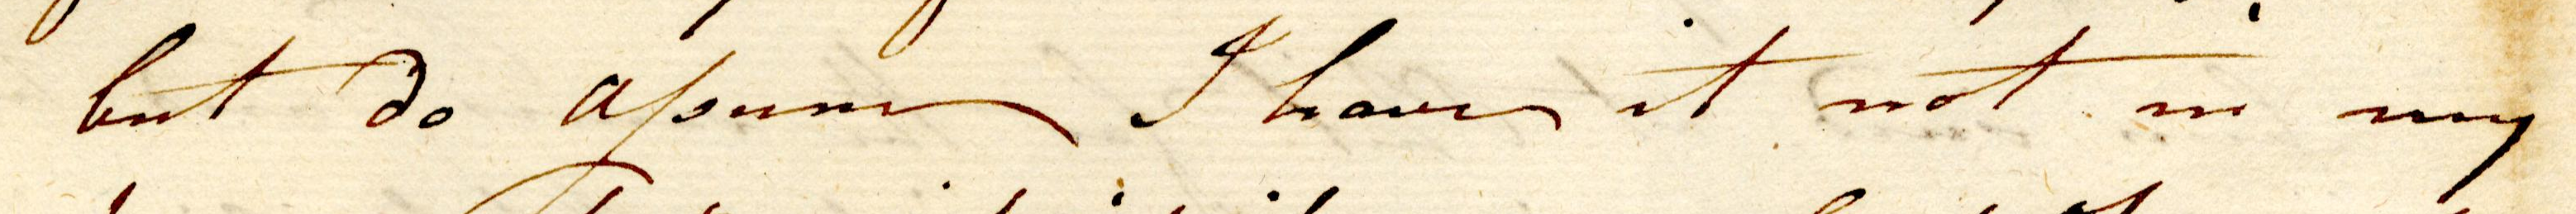but do assum I have it not in my
